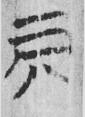而
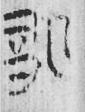訓（順）
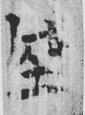城（成）
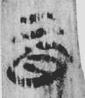百
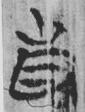眚（姓）
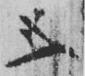之
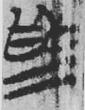爲
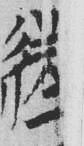城（成）
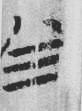丹
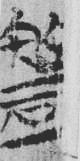箸（書）
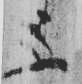之
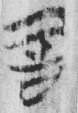言
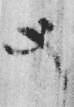又（有）
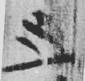之
